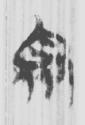眾
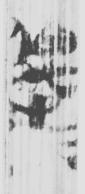{偶心}=
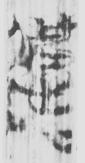{人皮心}=
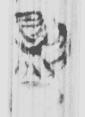則
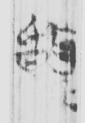䎽=
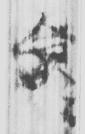命=
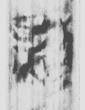則
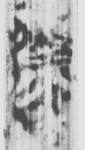備
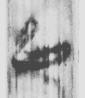㠯（以）
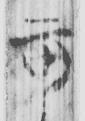可
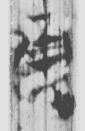甬
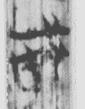威
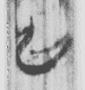㠯（以）
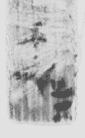十三
